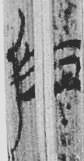於
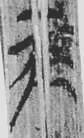天
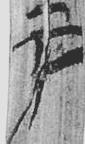下
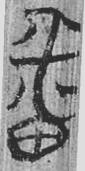番
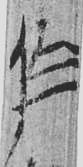於
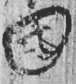囦（淵）
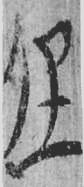坐
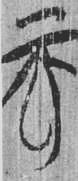而
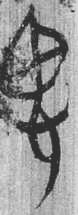思
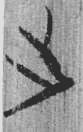之
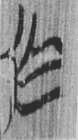於
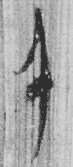千
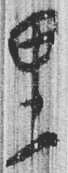里
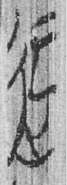○（起）
